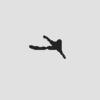又
